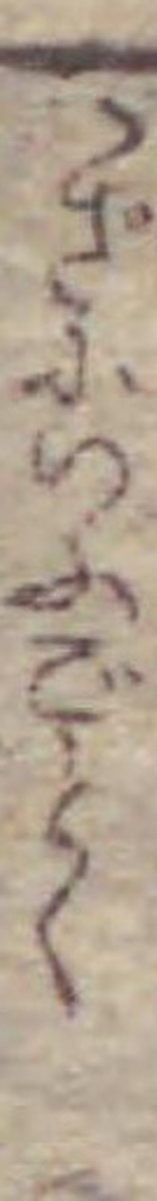はざにいふごとく
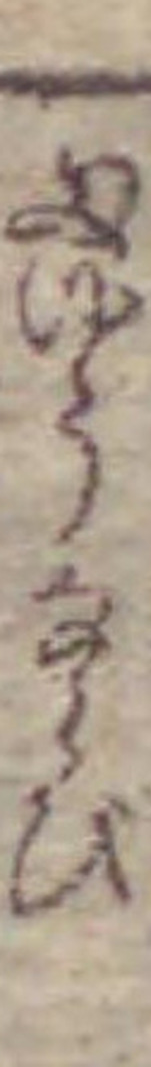両ゆうならび
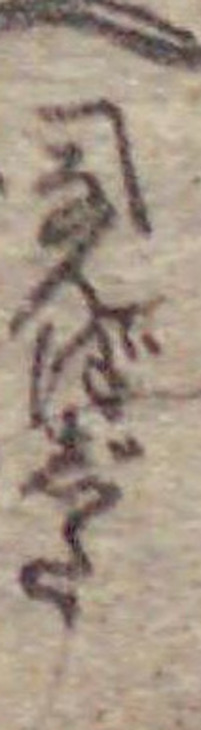〽なんぼじた
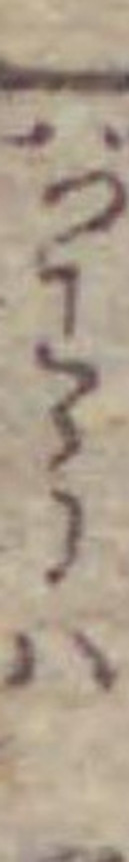ぢわうは
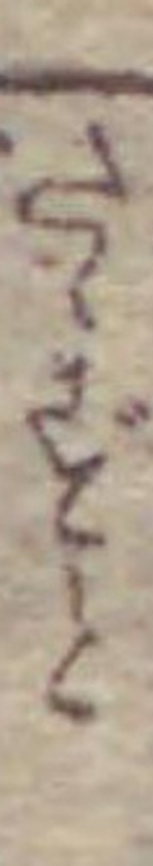たゝずと
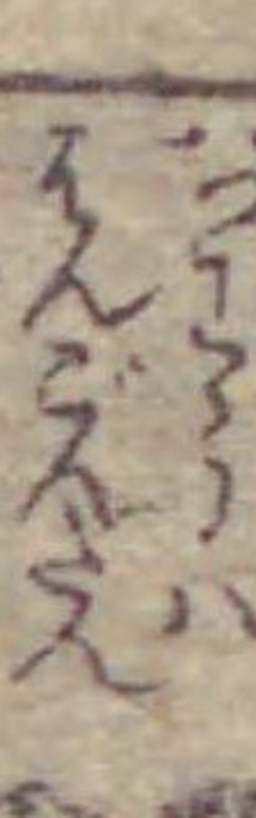はんごんたん
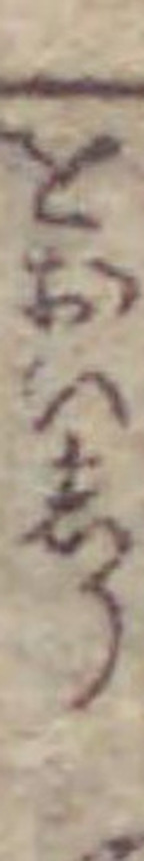をおいしり
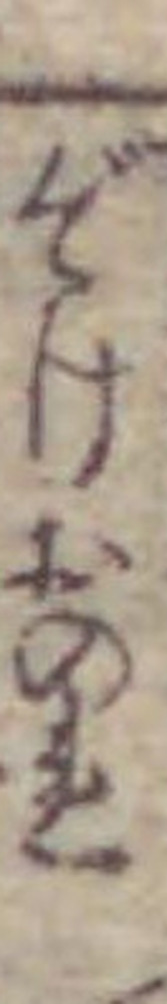ぞけおのれ
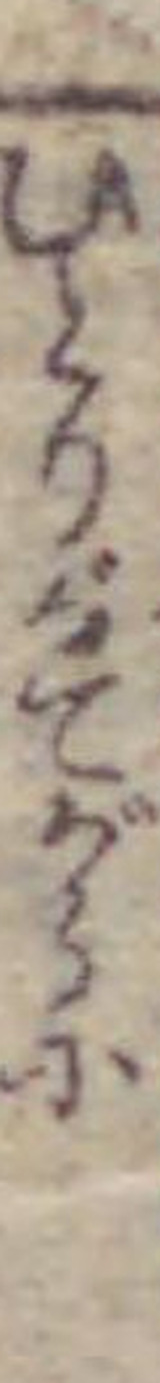ひとりがてがらに
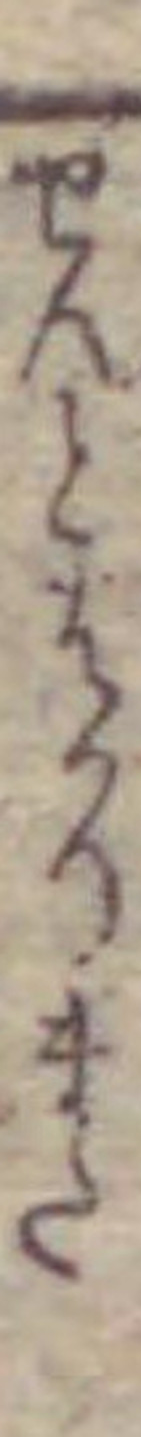せんとはかりまた
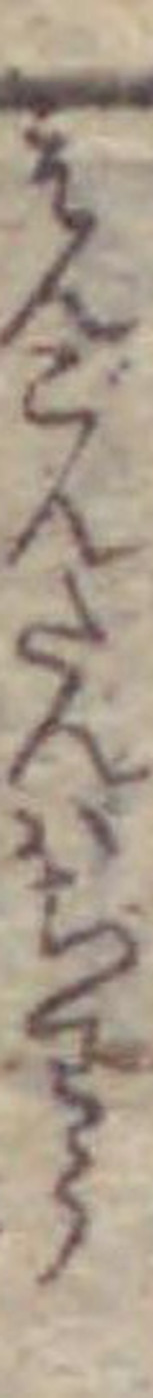はんごんたんはちわう
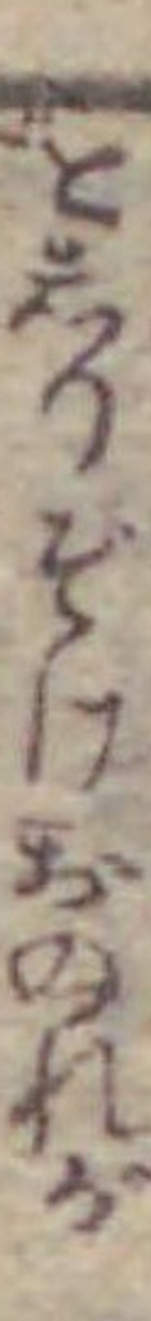をしりぞけおのれが
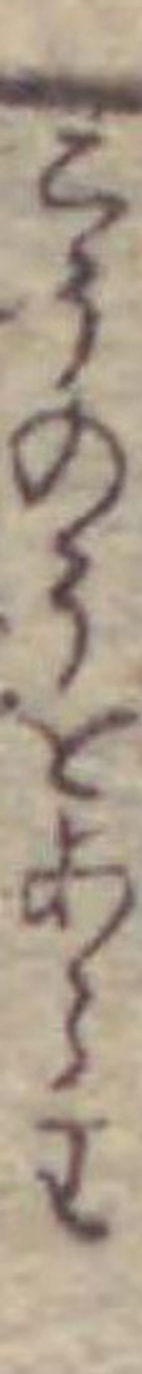こうのうをあらわ
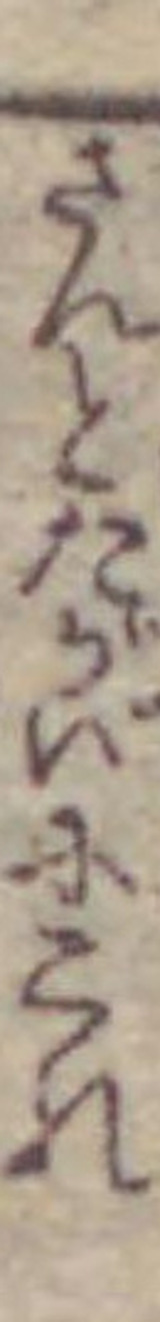さんとたがいにこれ
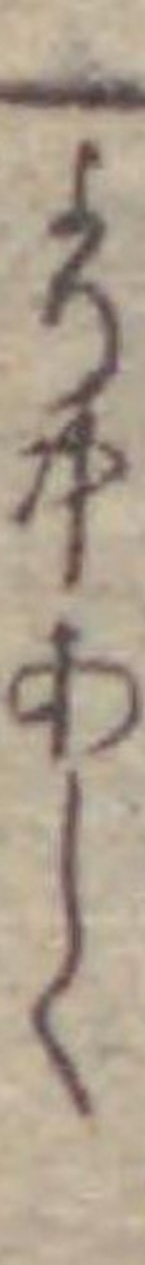より中あしく
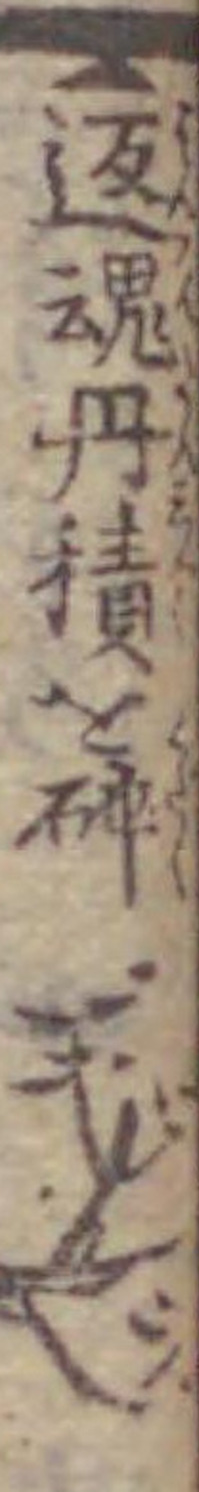▲返魂丹積を砕
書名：鼻下長生薬 : 3巻
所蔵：国立国会図書館 National Diet Library, JAPAN
